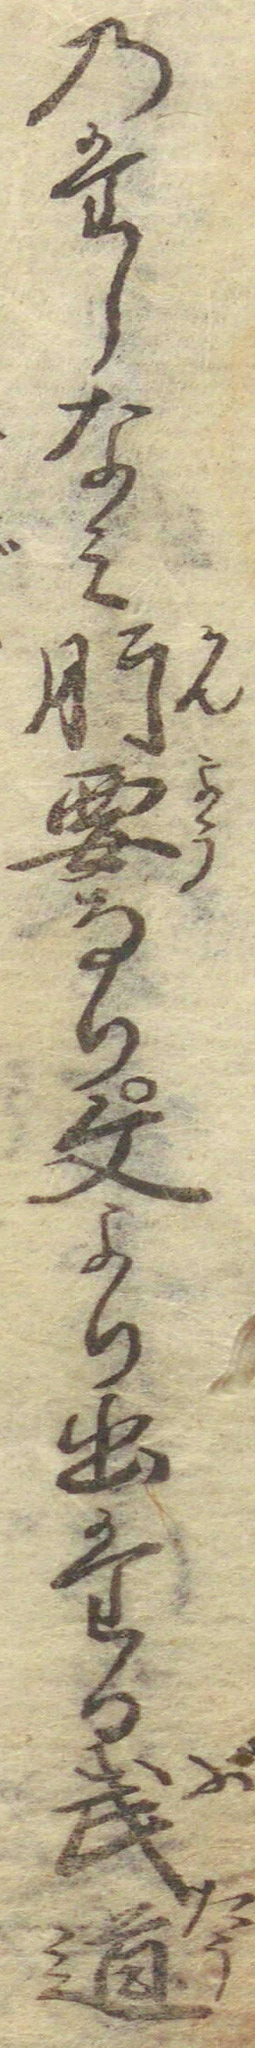のたしなみ肝要なり。文より出たる武道
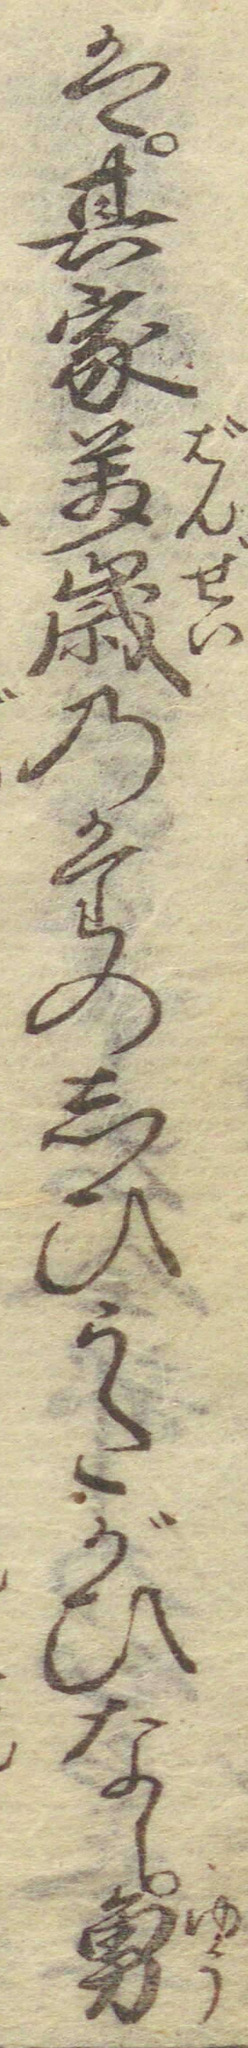は。其家萬歳のたのしひうたがひなし。勇
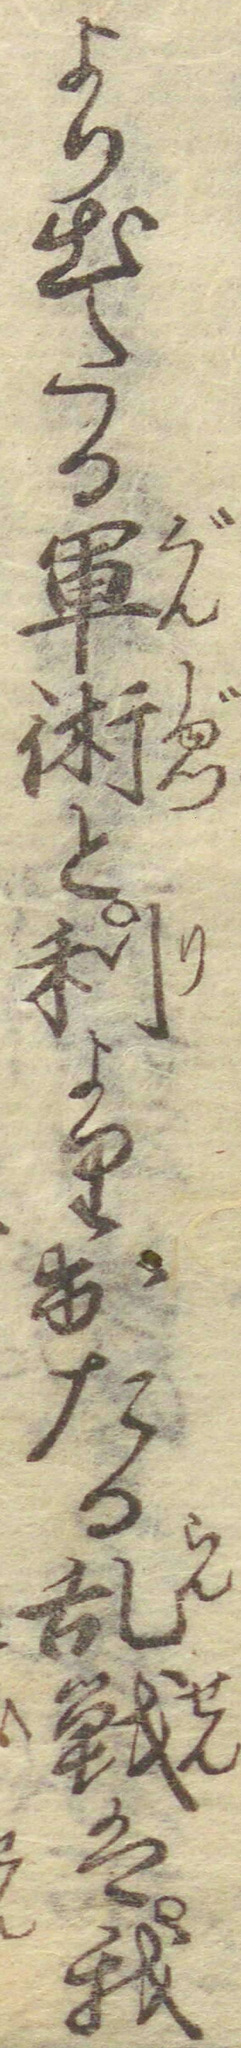より出たる軍術と。利より出たる乱戦は。我
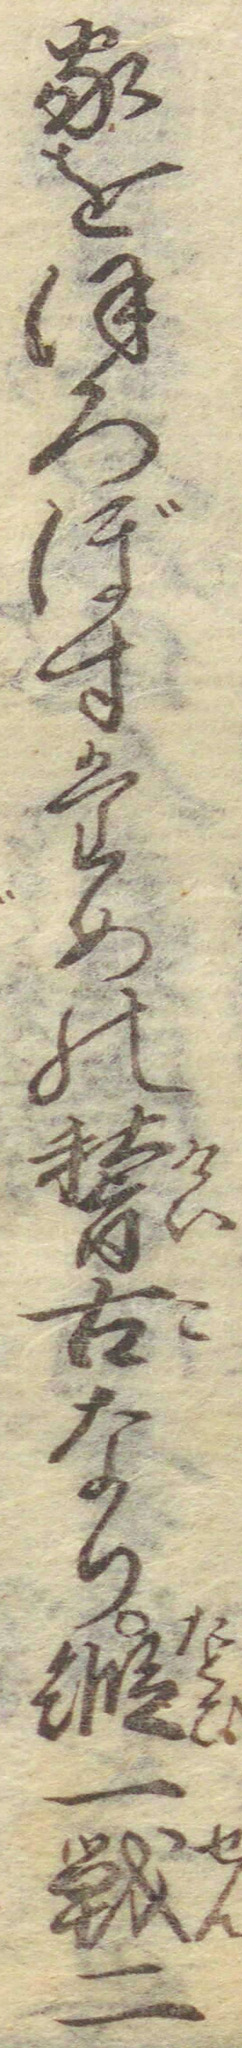家をほろぼすための稽古なり。縦一戦二
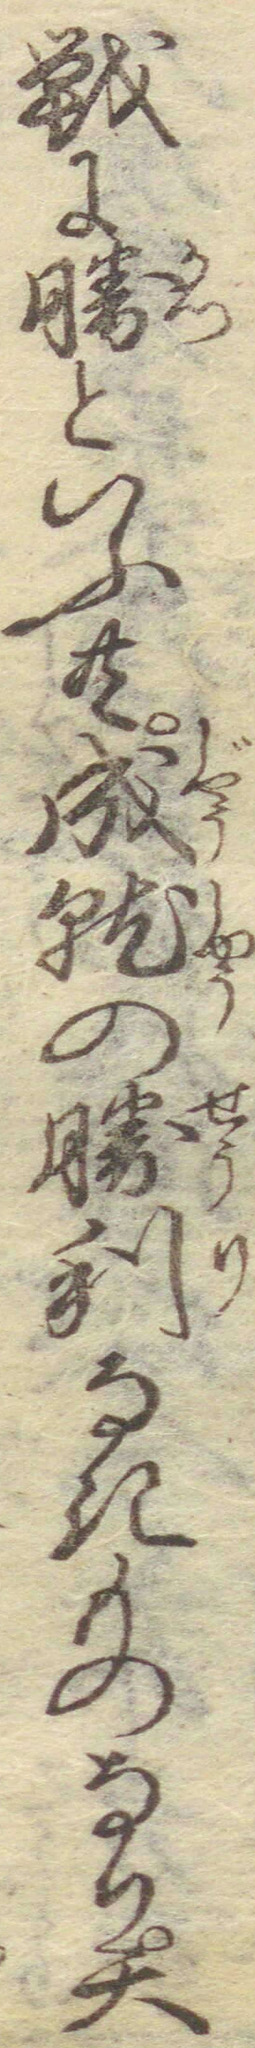戦に勝といふ共。成就の勝利なきものなり。天
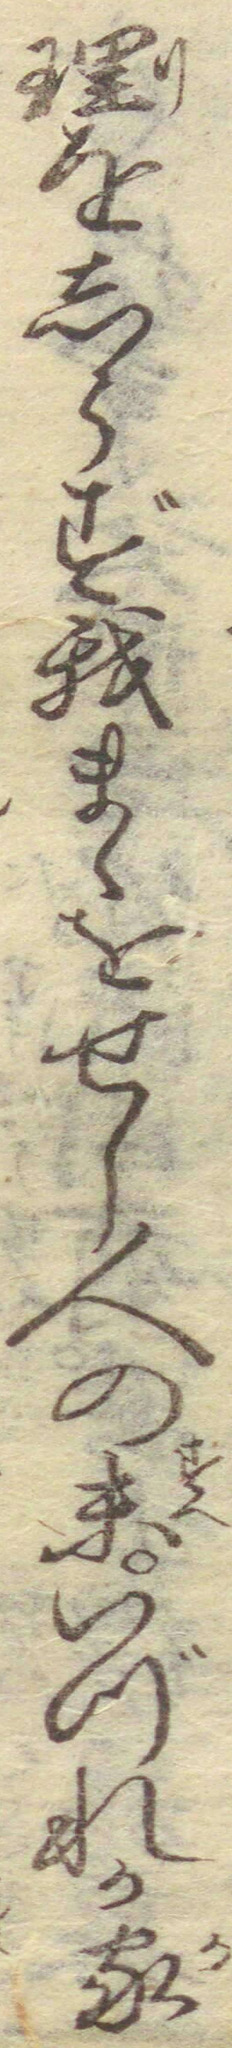理を知らず我まゝをせし人の末。いづれか家
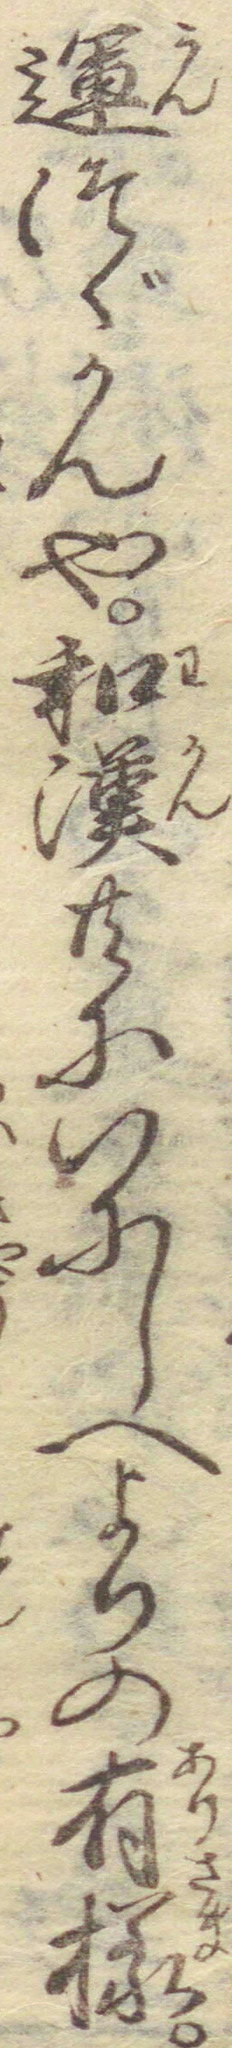運つゞかんや。和漢共にいにしへよりの有様。
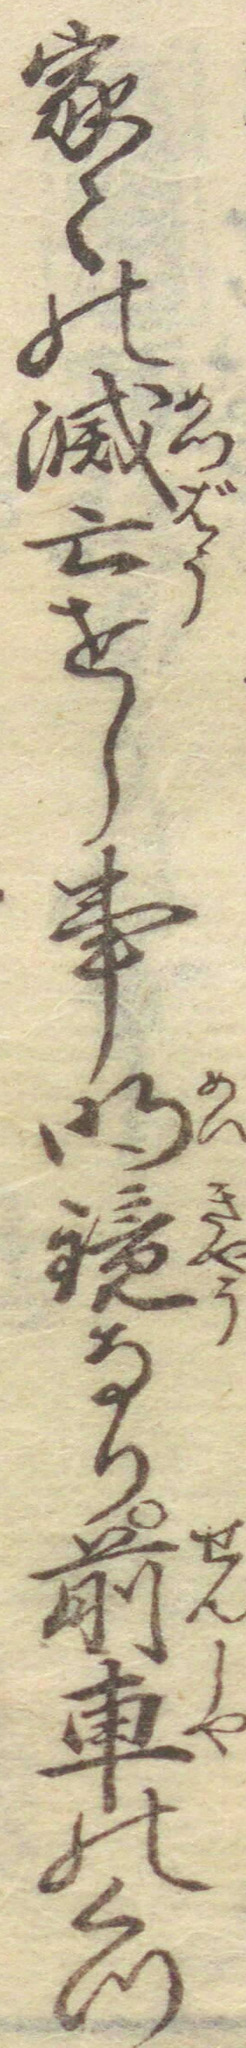家々の滅亡せし事明鏡なり。前車のくつ
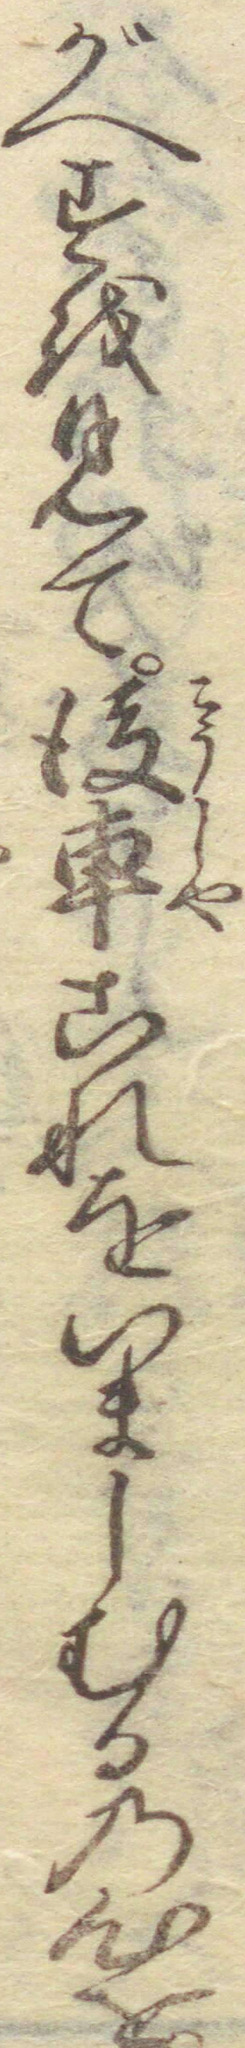がへすを見て。後車これをいましむるの心を。
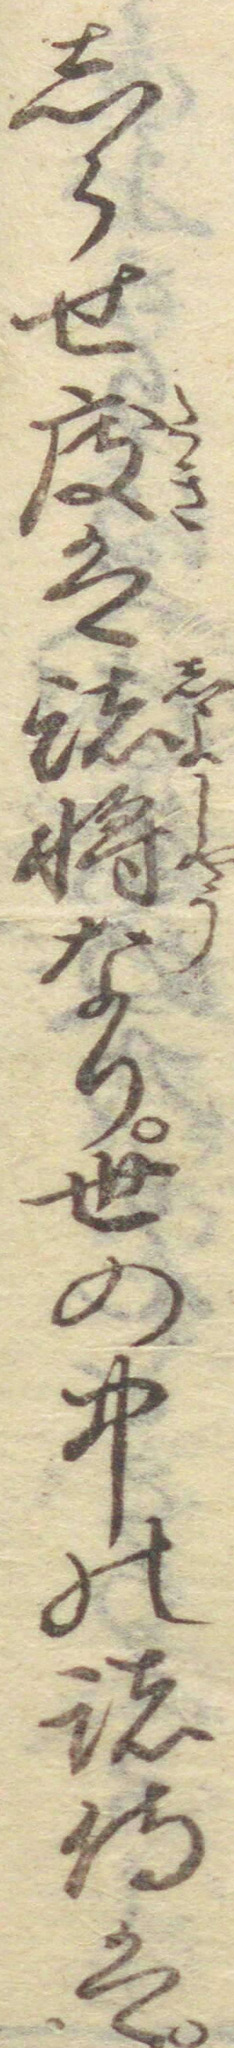しらせ度は諸将なり。世の中の諸侍は。
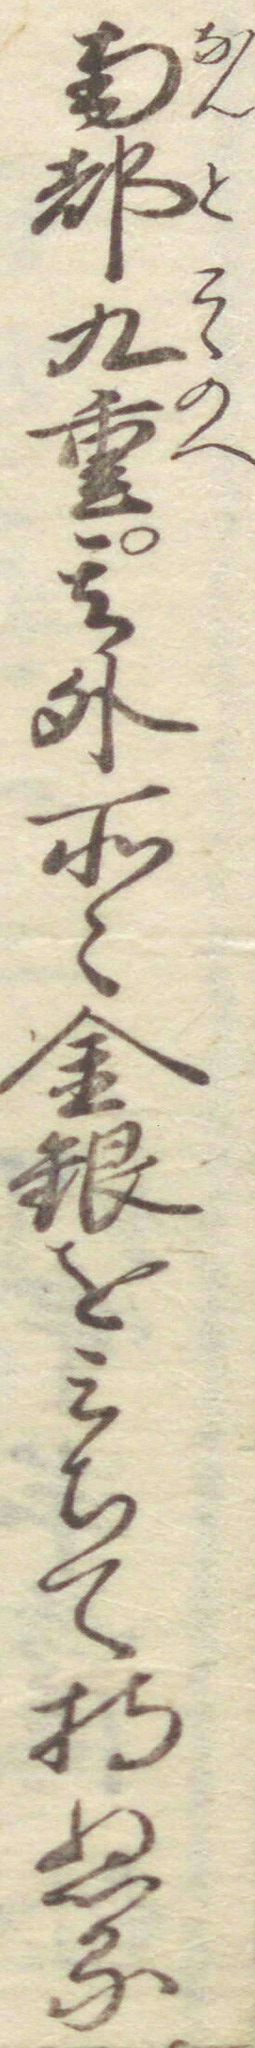南都九重。其外所々金銀をみちて持ぬる
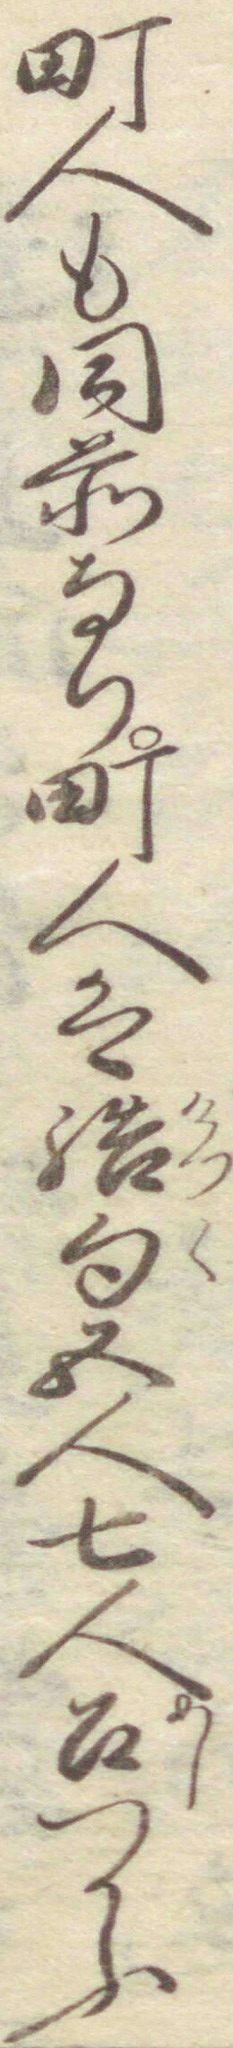町人も同前なり。町人は結句五人七人召つかふ
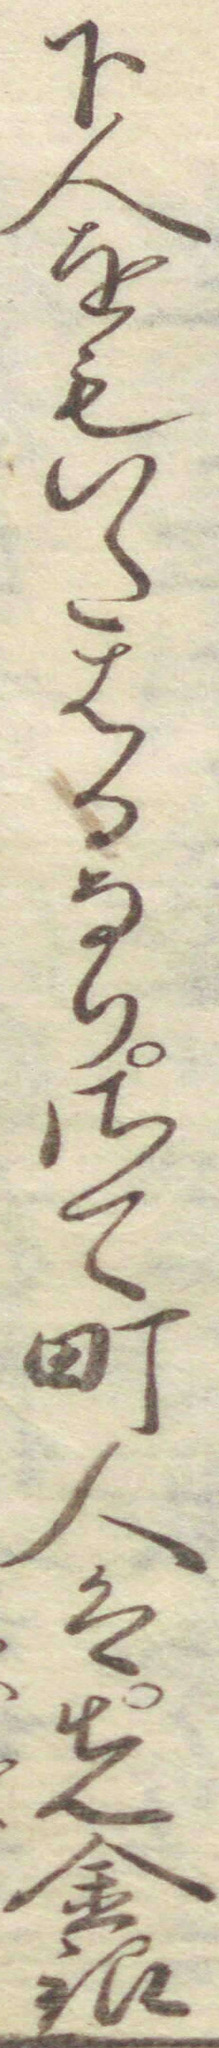下人をもいたはるなり。さて町人は。先金銀
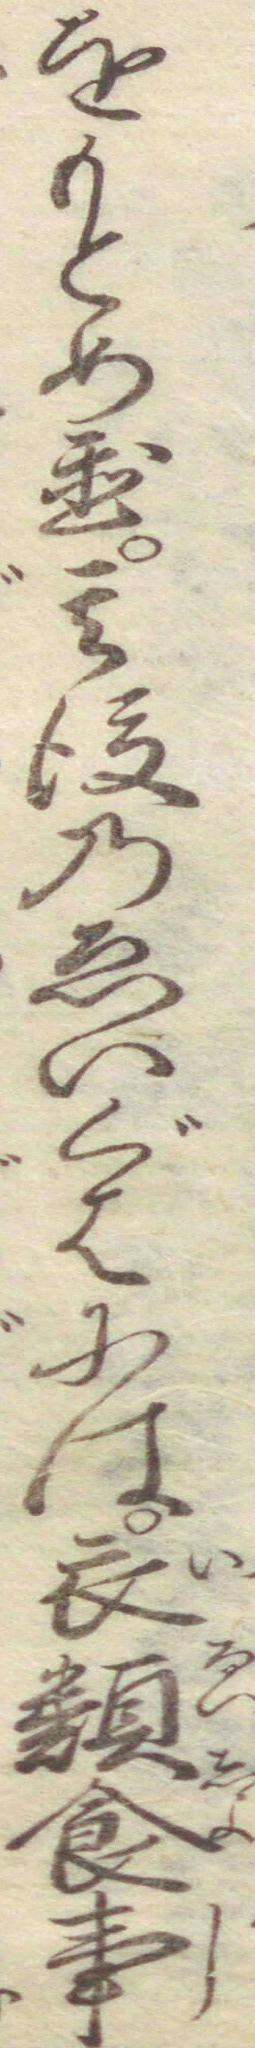をもとめ置。其後のゑいぐはには。衣類食事
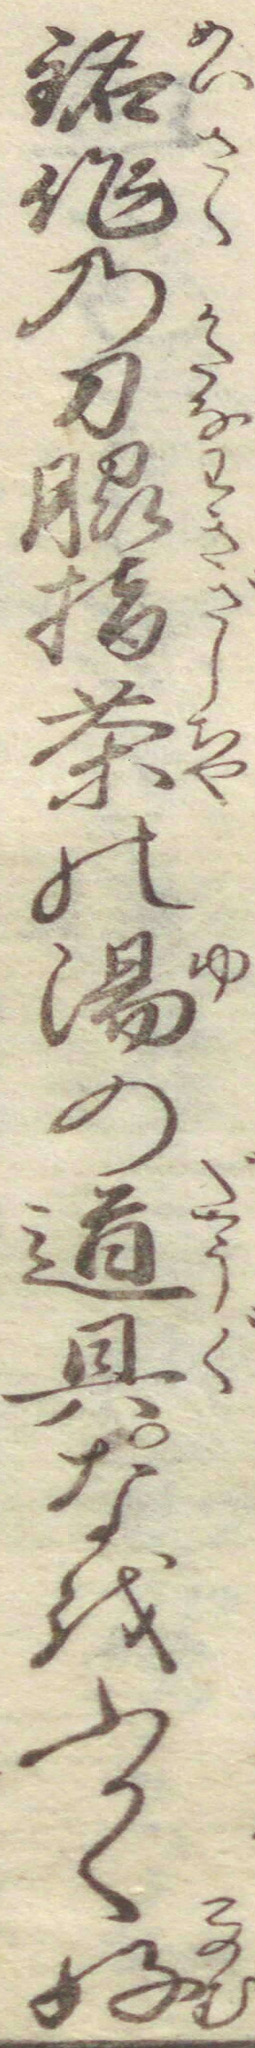銘作の刀脇指茶の湯の道具。なをふかく好
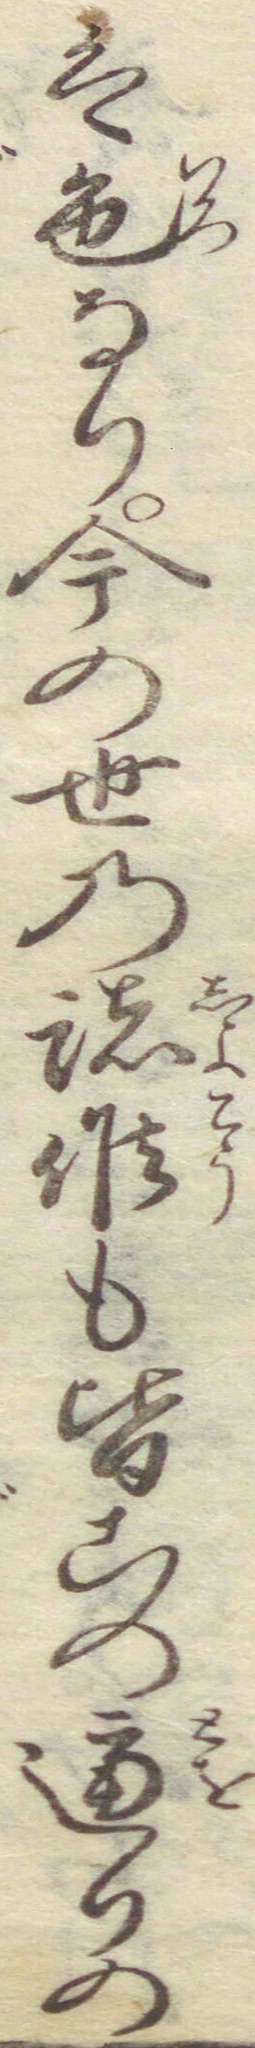は色なり。今の世の諸侯も皆この通りの
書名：軍法極秘傳書
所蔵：国文学研究資料館
